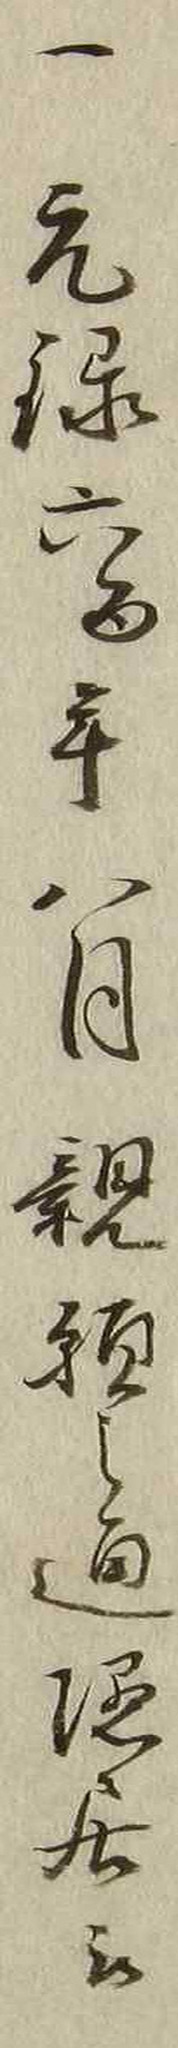一元録六酉年八月親願之通隠居被
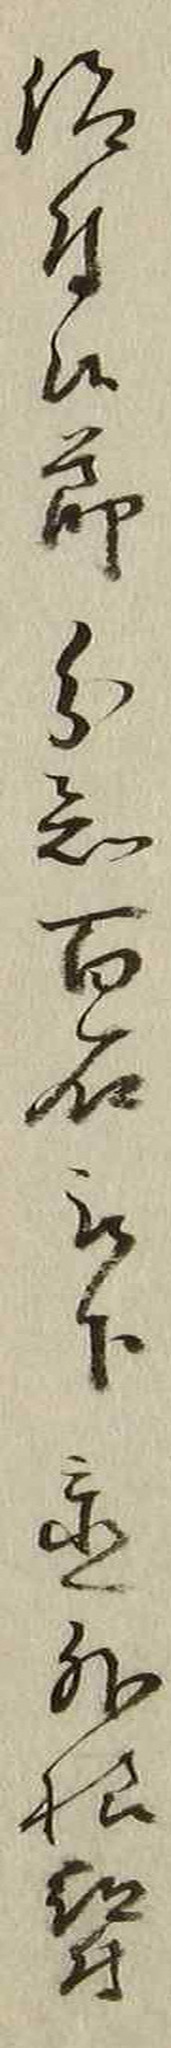仰付候節分知百石被下置外様組付
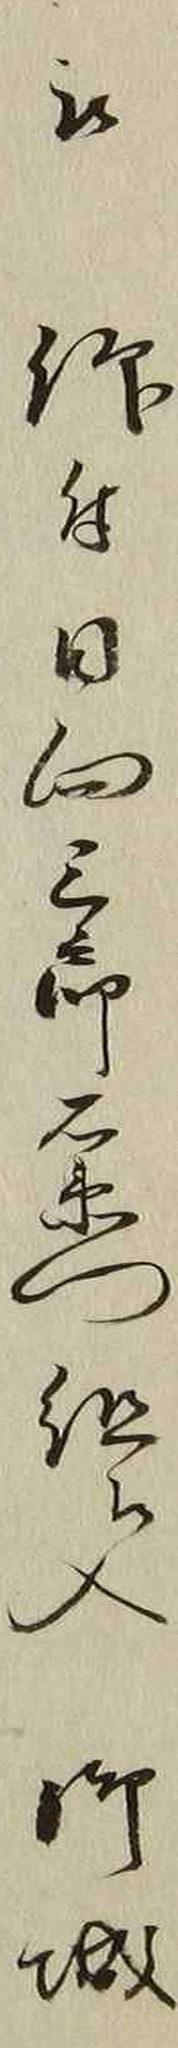被仰付日向三郎右衛門組江入御城
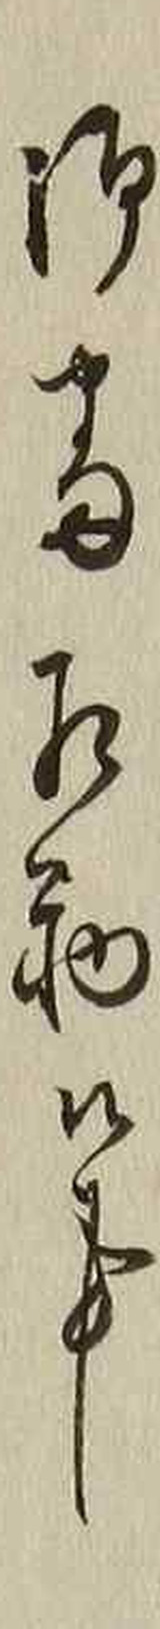御番相勤候事
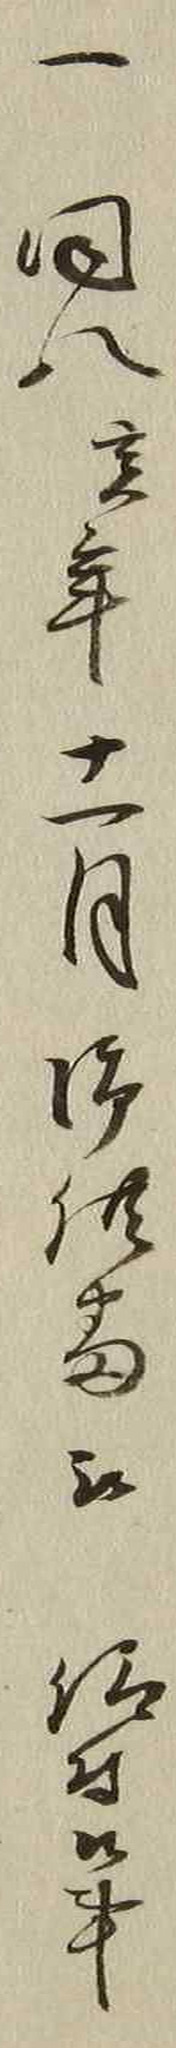一同八亥年十一月御供番被仰付候事
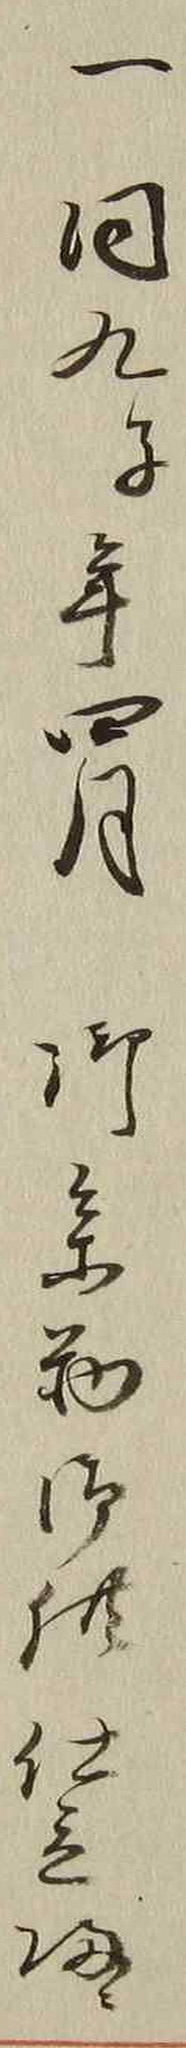一同九子年四月御参勤御供仕立帰ニ
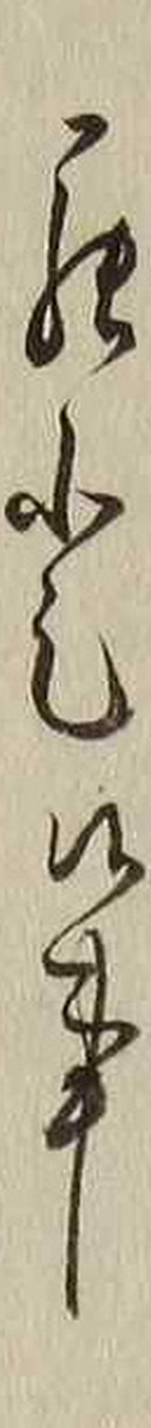罷登候事
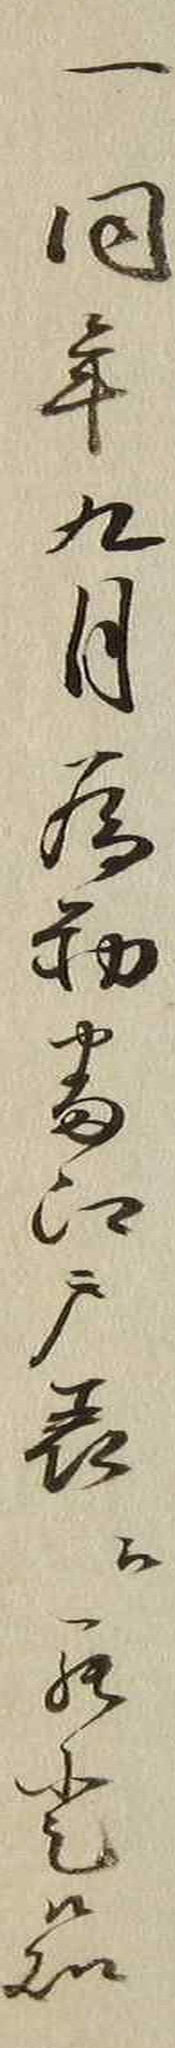一同年九月為勤番江戸表江罷登候処
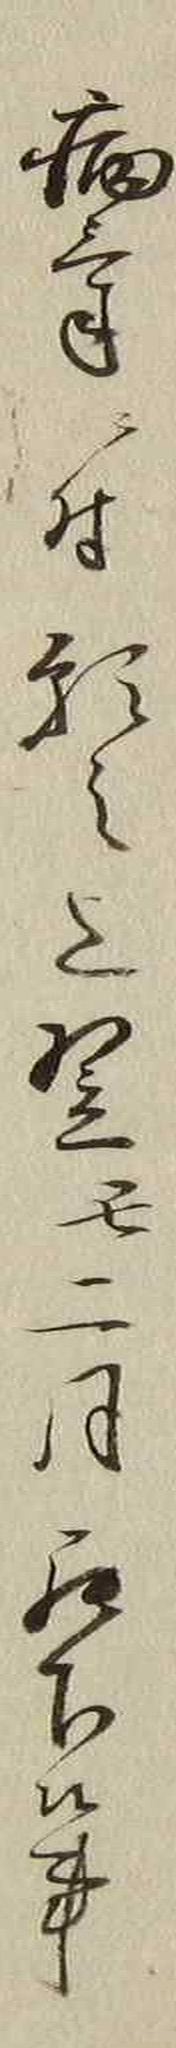病気ニ付願之上翌丑二月罷下候事
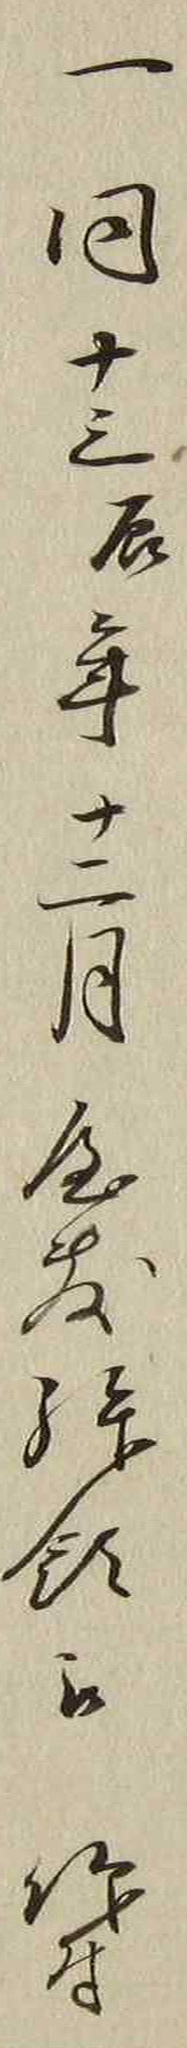一同十三辰年十二月屋敷拝領被仰付
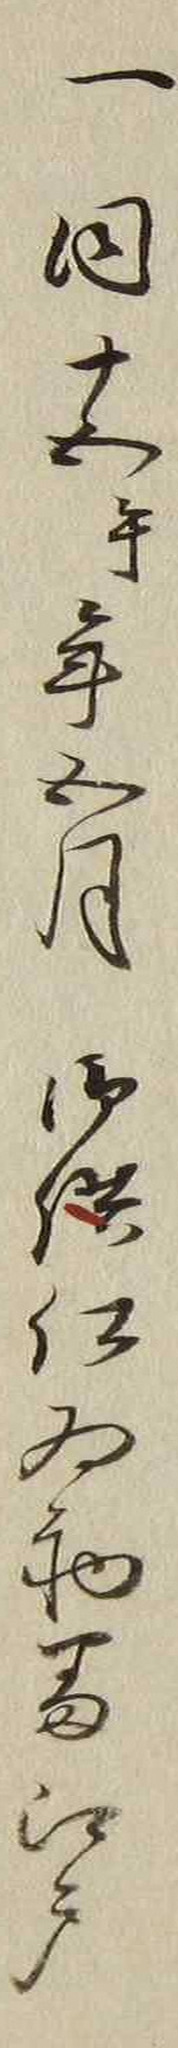一同十五午年五月御供仕為勤番江戸
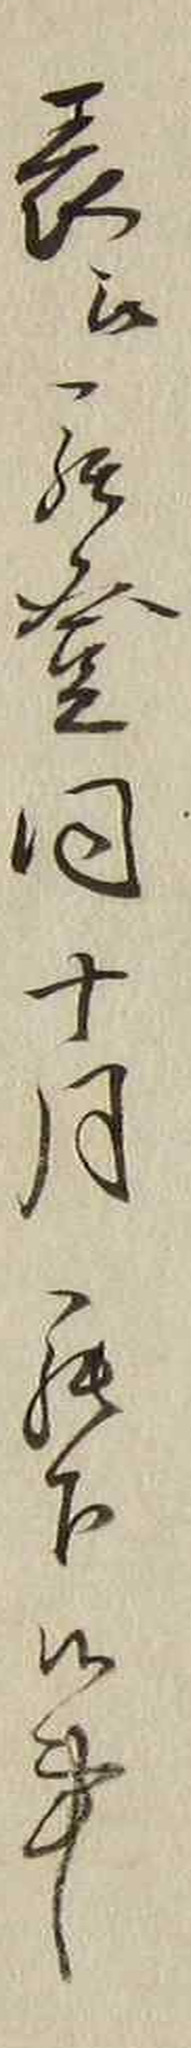表江罷登同十月罷下候事
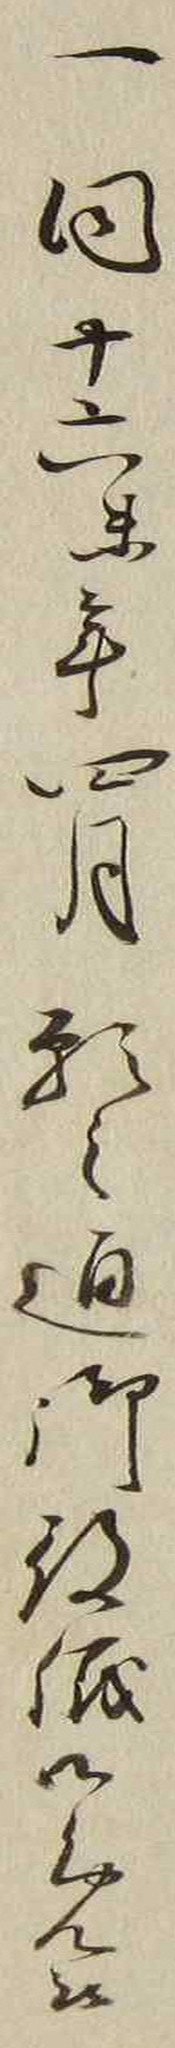一同十六未年四月願々通御役儀御免被
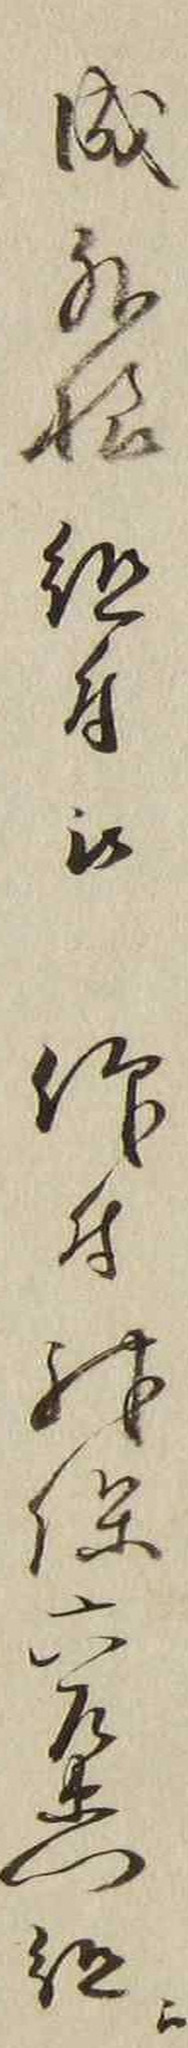成外様組付被仰付神保六左衛門組江

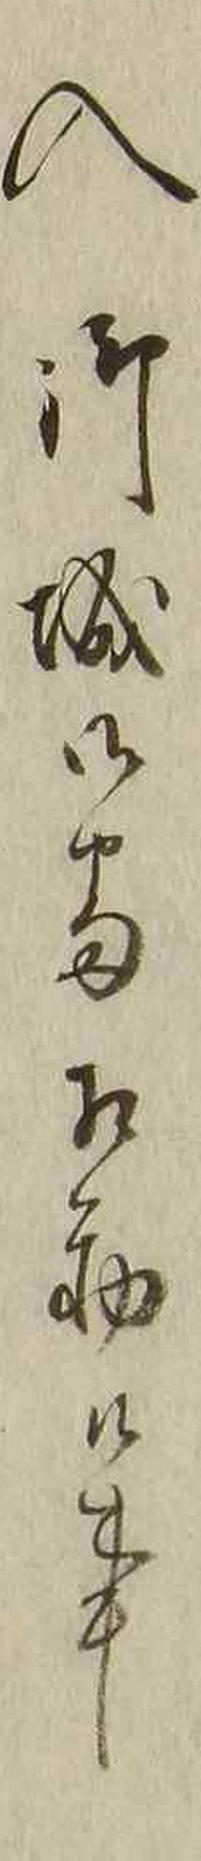入御城御番相勤候事
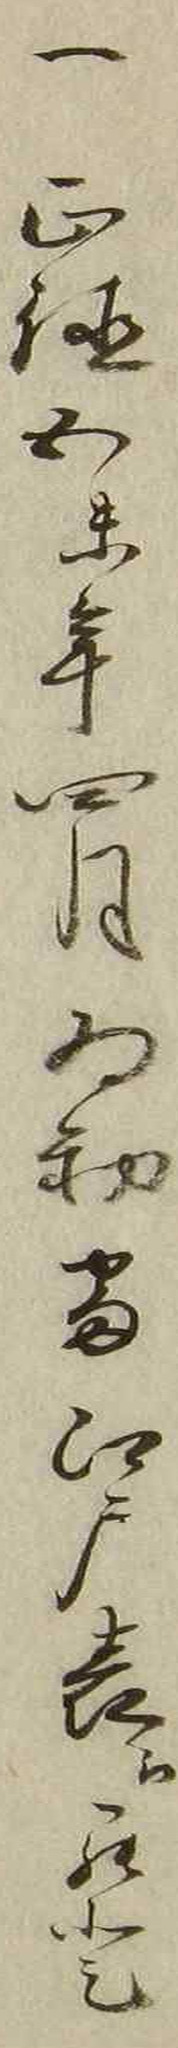一正徳五未年四月為勤番江戸表江罷登
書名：諸士系譜　巻之25　い之部25
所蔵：会津若松市立会津図書館
